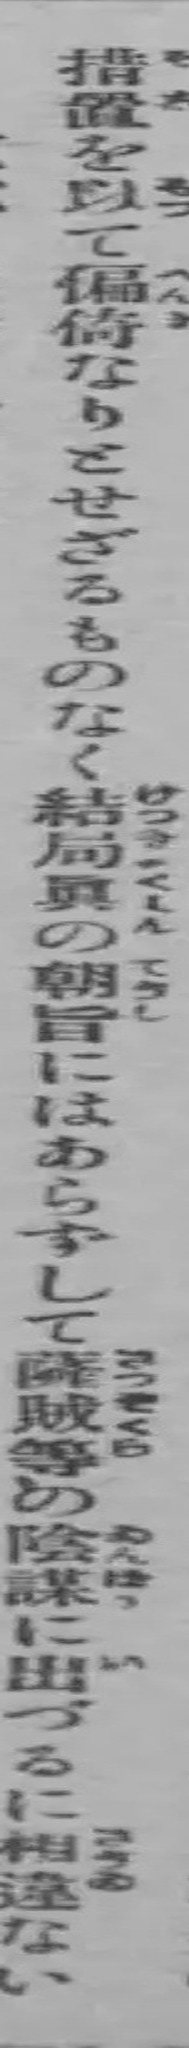措置を以て偏倚なりとせざるものなく結局真の朝旨にはあらずして薩賊等の陰謀に出づるに相違ない
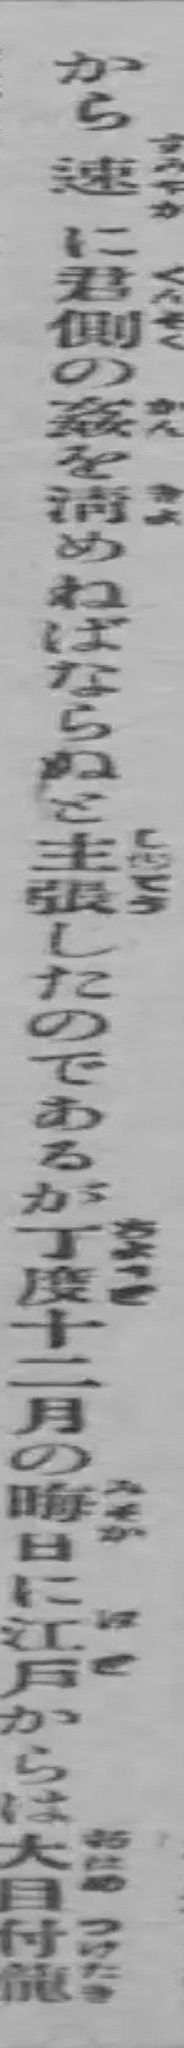から速に君側の姦を清めねばならぬと主張したのであるが丁度十二月の晦日に江戸からは大目付瀧
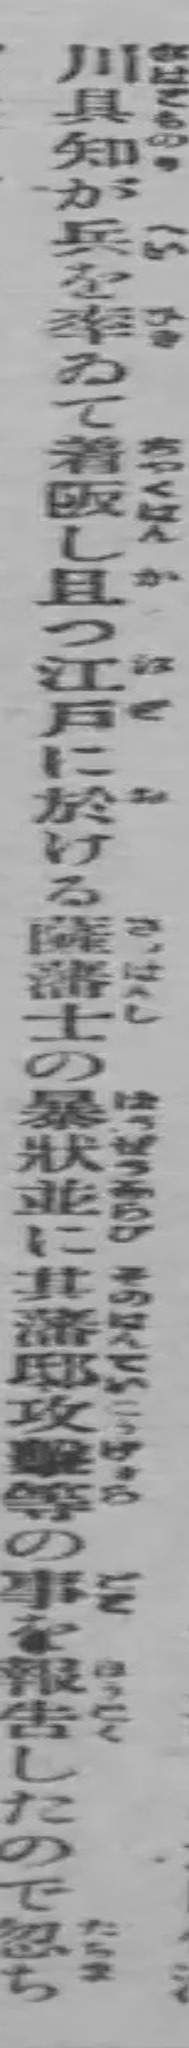川具知が兵を率ゐて着阪し且つ江戸に於ける薩藩士の暴状並に其藩邸攻撃等の事を報告したので忽ち
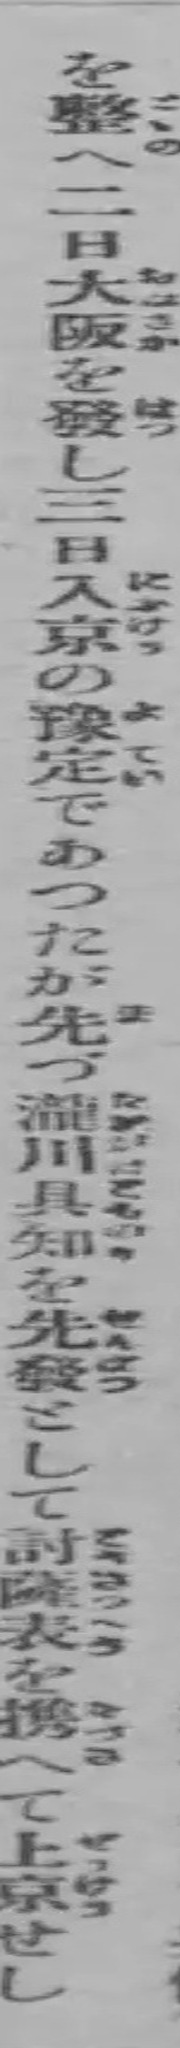を整へ二日大阪を発し三日入京の予定であつたが先づ瀧川具知を先発として討薩表を携へて上京せし
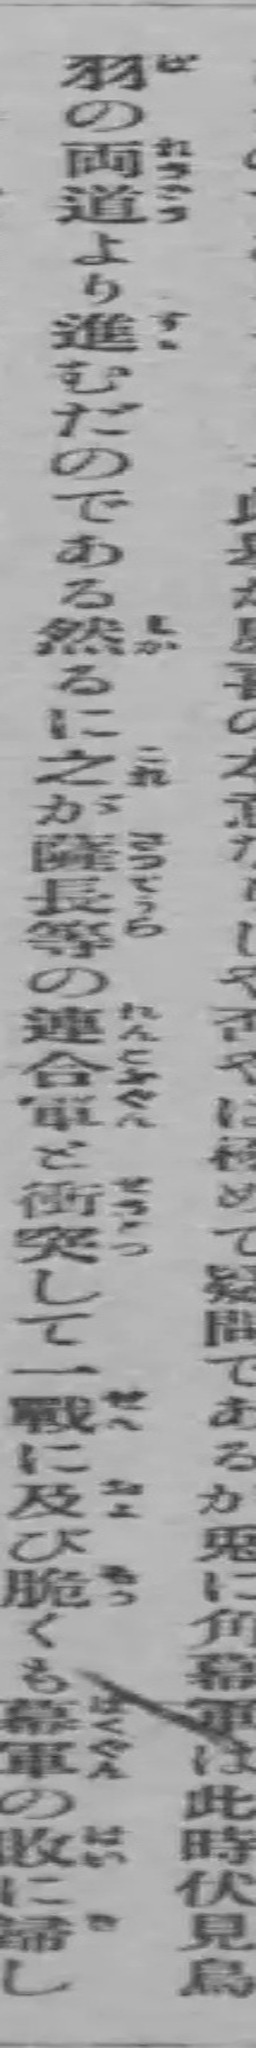羽の両道より進むだのである然るに之が薩長等の連合軍と衝突して一戦に及び脆くも幕軍の敗に帰し
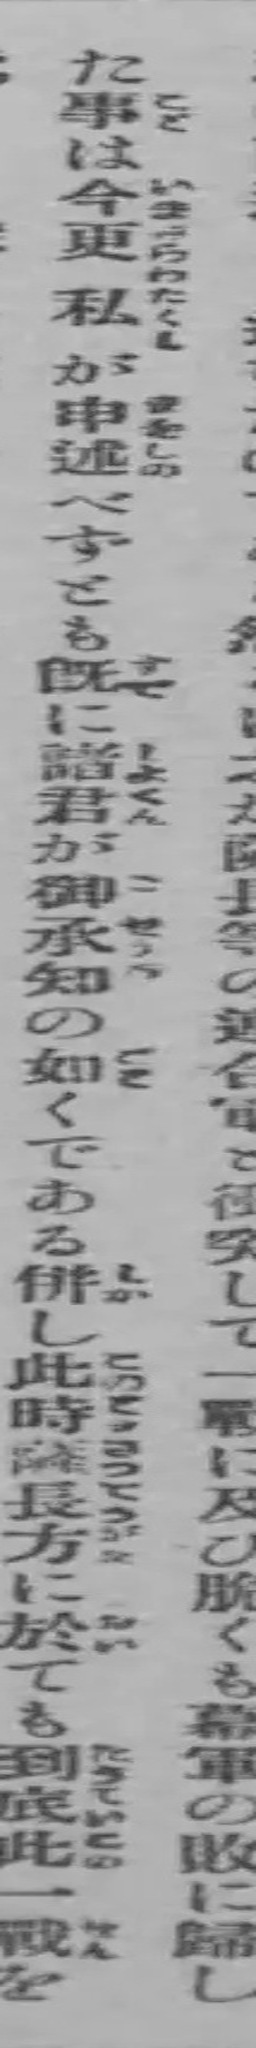た事は今更私が申述べずとも既に諸君が御承知の如くである併し此時薩長方に於ても到底此一戦を
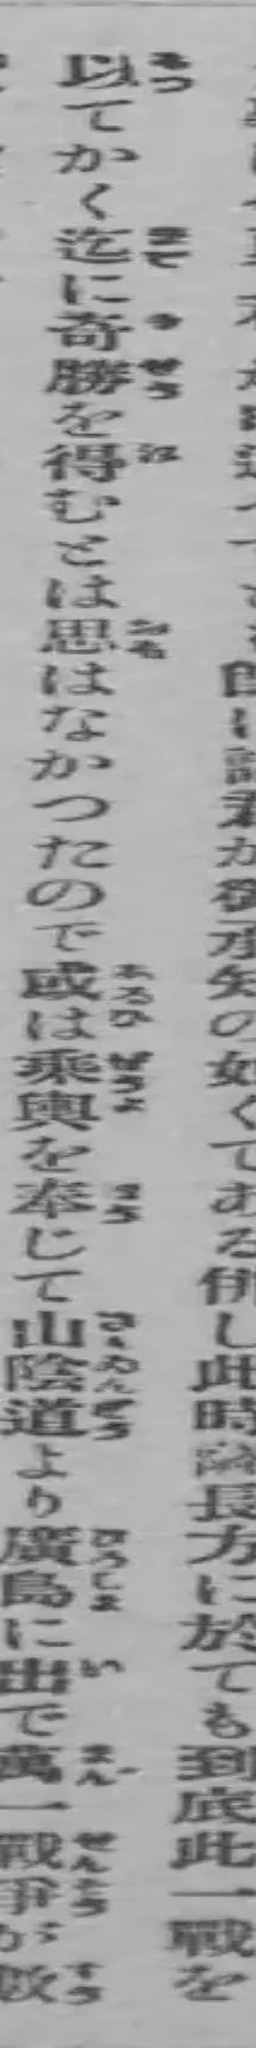以てかく迄に奇勝を得むとは思はなかつたので或は乗輿を奉じて山陰道より広島に出で万一戦争が数
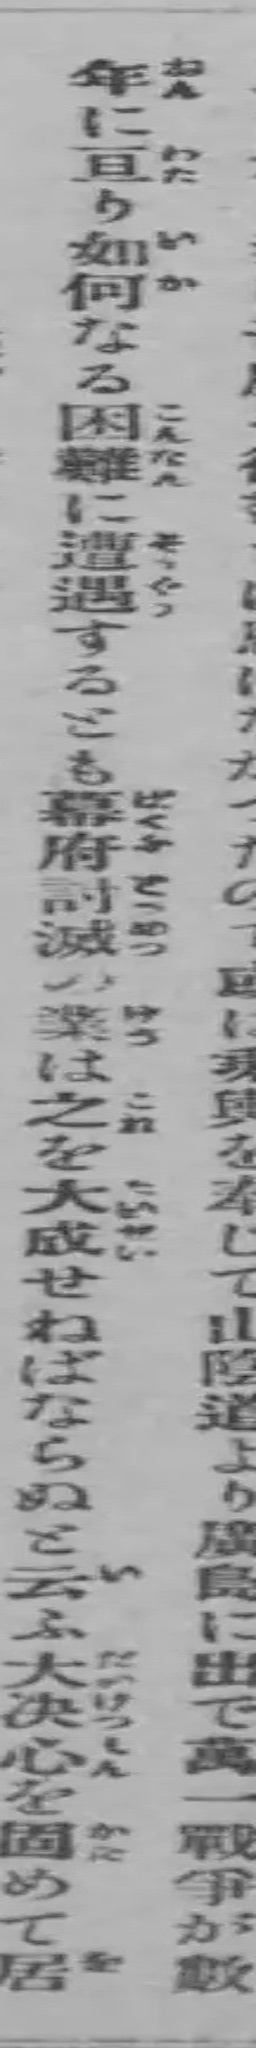年に亘り如何なる困難に遭遇するとも幕府討滅の業は之を大成せねばならぬと云ふ大決心を固めて居
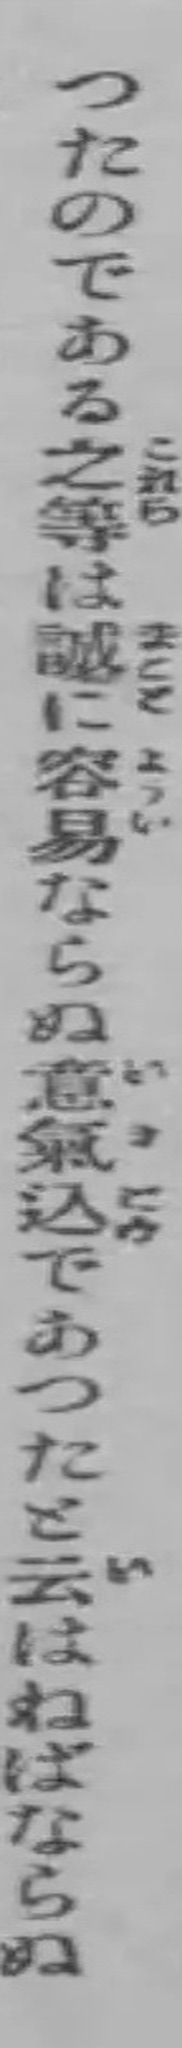つたのである之等は誠に容易ならぬ意気込であつたと云はねばならぬ
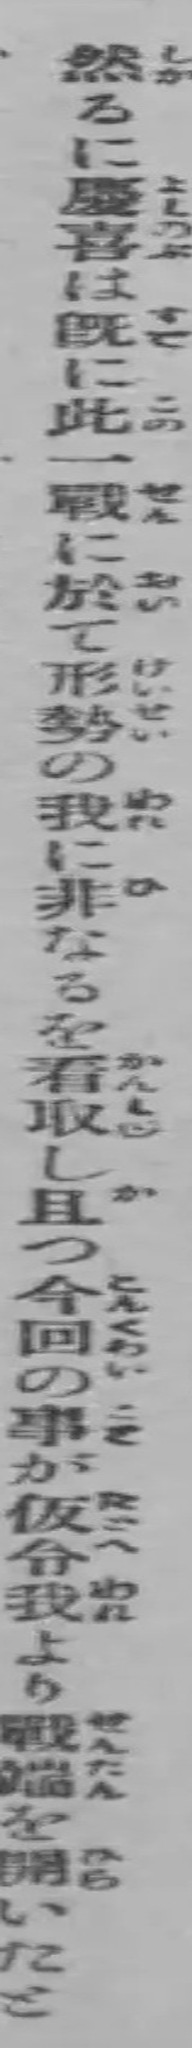然るに慶喜は既に此一戦に於て形勢の我に非なるを看取し且つ今回の事が仮令我より戦端を開いたと
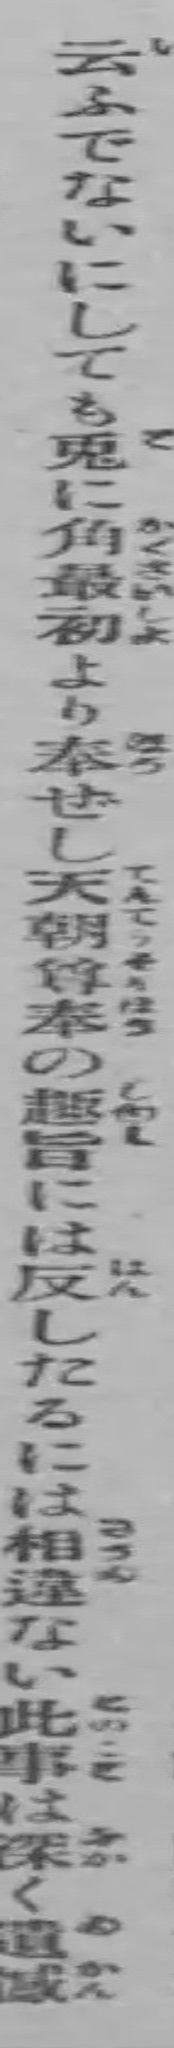云ふでないにしても兎に角最初より奉ぜし天朝尊奉の趣旨には反したるには相違ない此事は深く遺憾
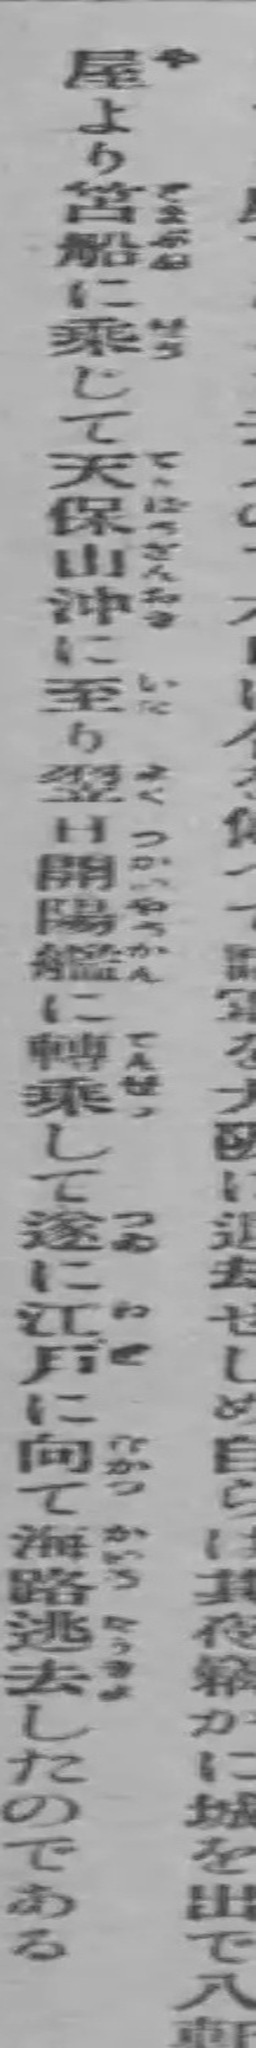屋より苫船に乗じて天保山沖に至り翌日開陽艦に転乗して遂に江戸に向て海路逃去したのである

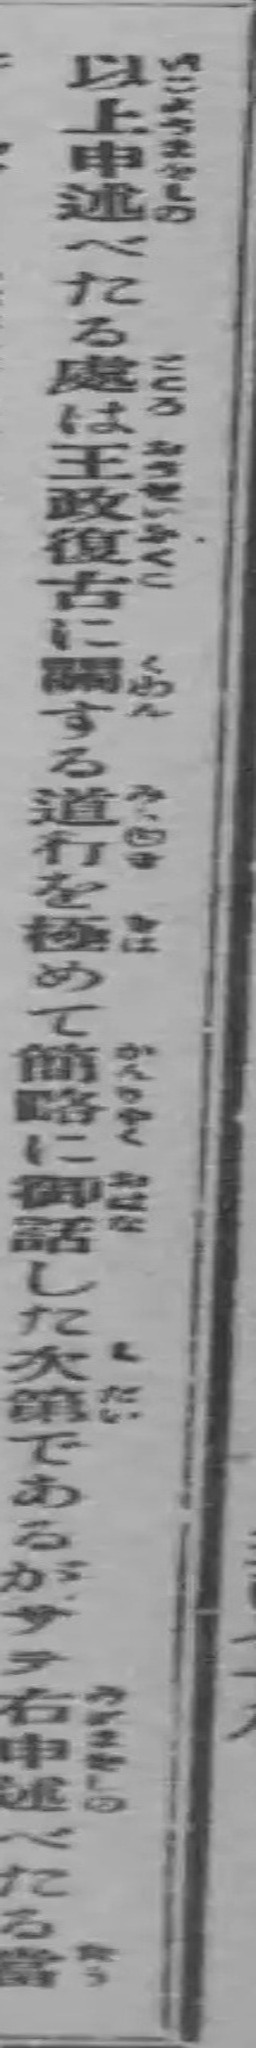以上申述べたる処は王政復古に関する道行を極めて簡略に御話した次第であるがサテ右申述べたる当
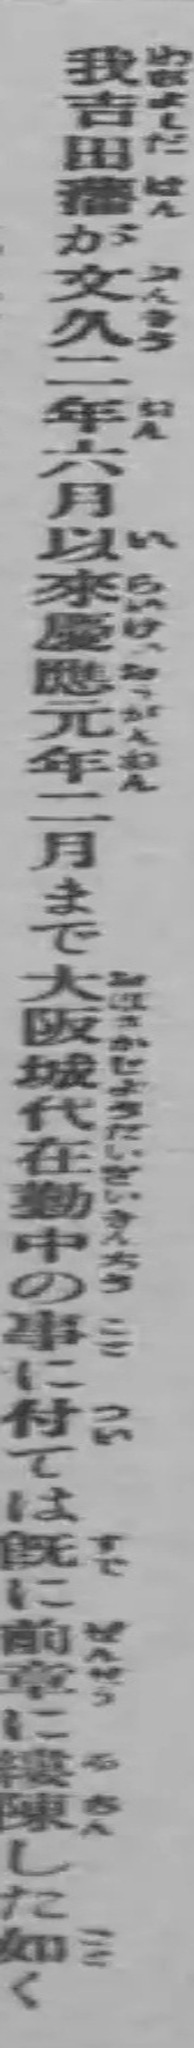我吉田藩が文久二年六月以来慶応元年二月まで大阪城代在勤中の事に付ては既に前章に縷陳した如く
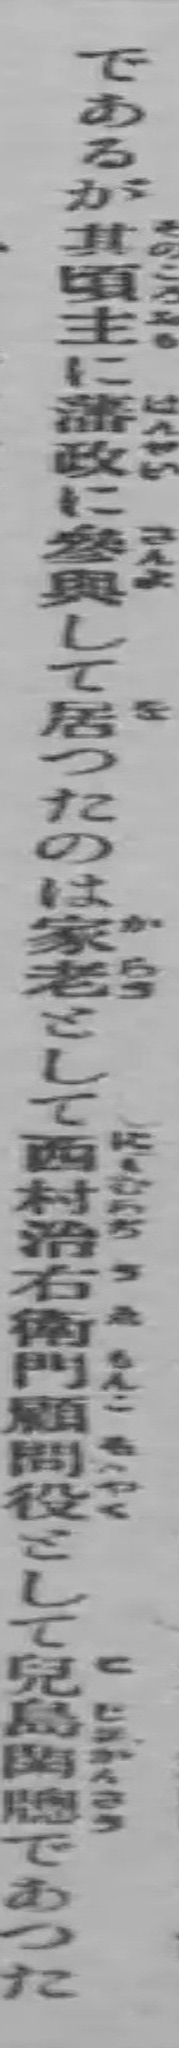であるが其頃主に藩政に参与して居つたのは家老として西村治右衛門顧問役として児島閑牕であつた
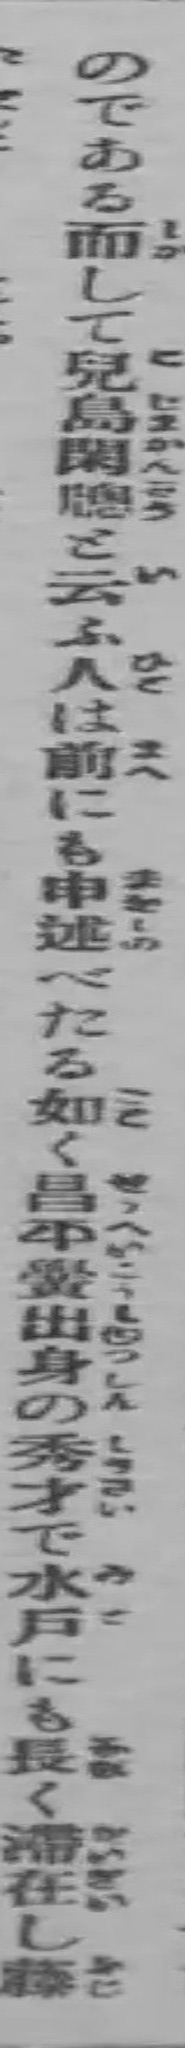のである而して児島閑牕と云ふ人は前にも申述べたる如く昌平黌出身の秀才で水戸にも長く滞在し藤
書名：豊橋市史談
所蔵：国立国会図書館 National Diet Library, JAPAN
